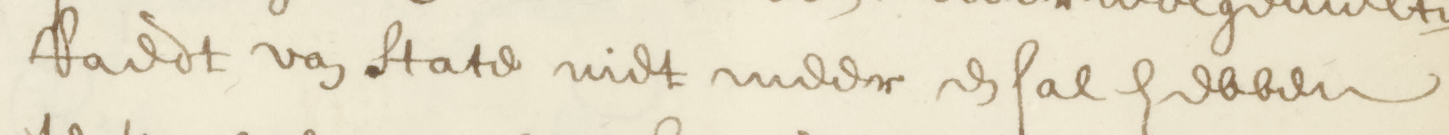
Raedt van State niet meer en sal hebben
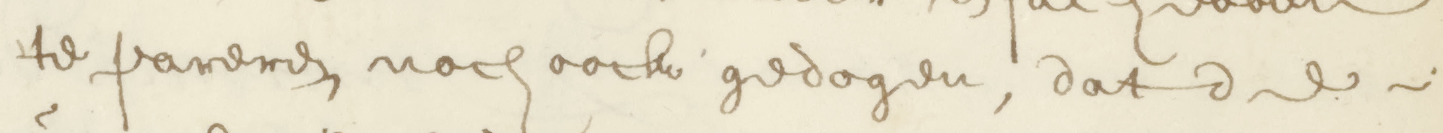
te pareren, noch oock gedogen, dat de
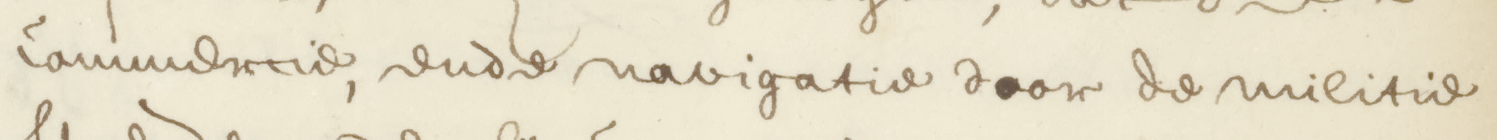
Commercie, ende navigatie door de militie
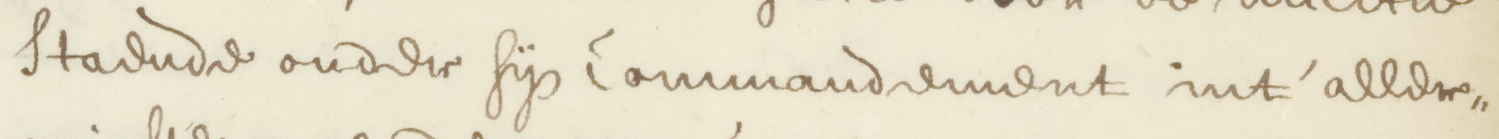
Staende onder sijn Commandement int' aller„
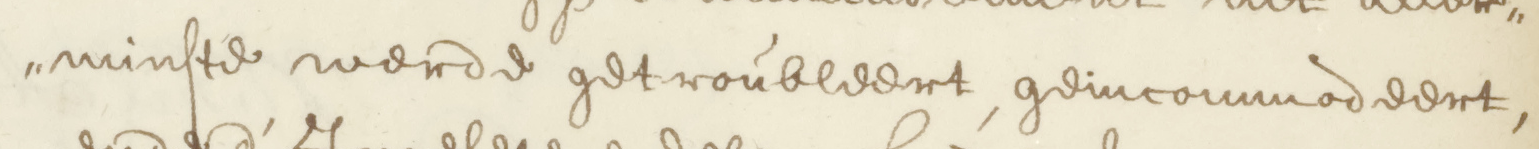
„minste werde getroubleert, geincommodeert,
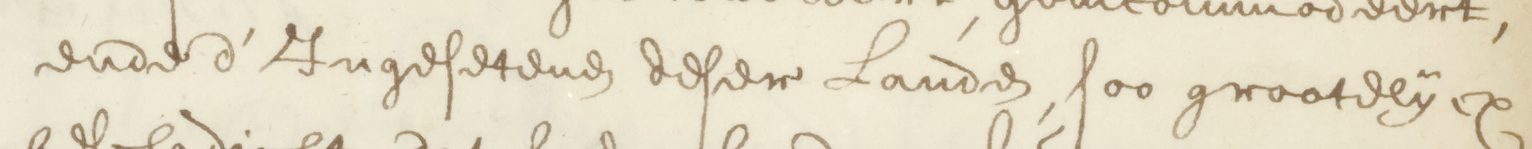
ende d'Ingesetenen deser Landen, soo grootelijcx
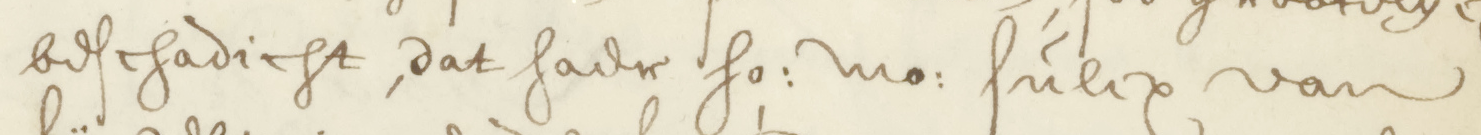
beschadicht, dat haer Ho:Mo: sulcx van
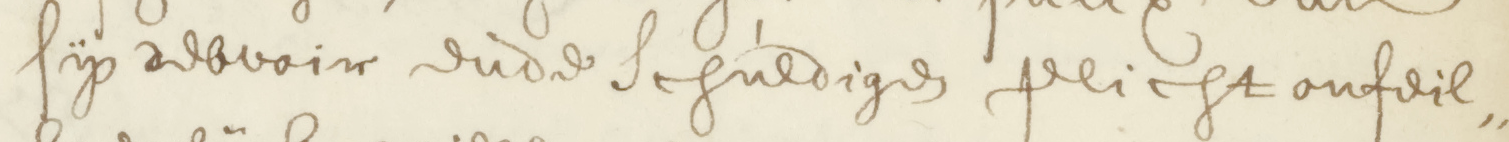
sijn debvoir ende Schuldigen plicht onfeil„
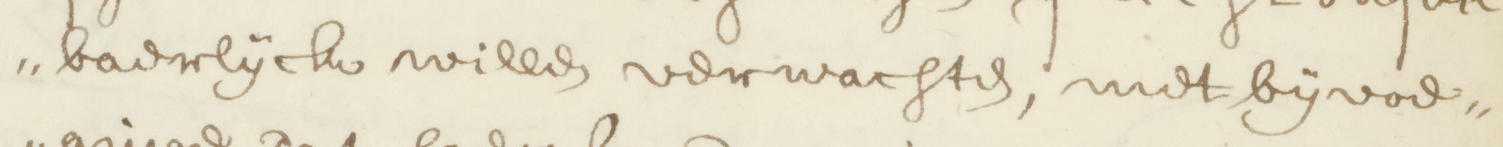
„baerlijck willen verwachten, met bijvoe„
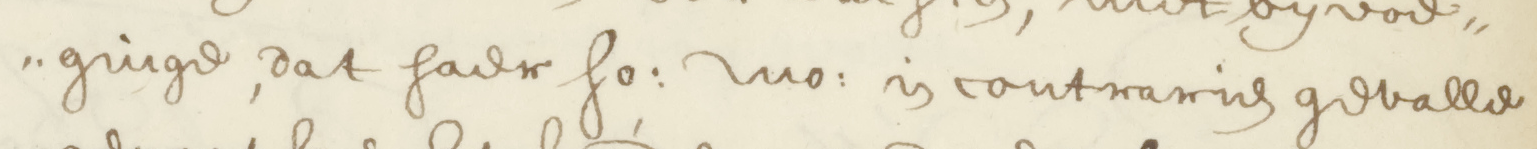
„ginge, dat haer Ho:Mo: in contrarien gevalle
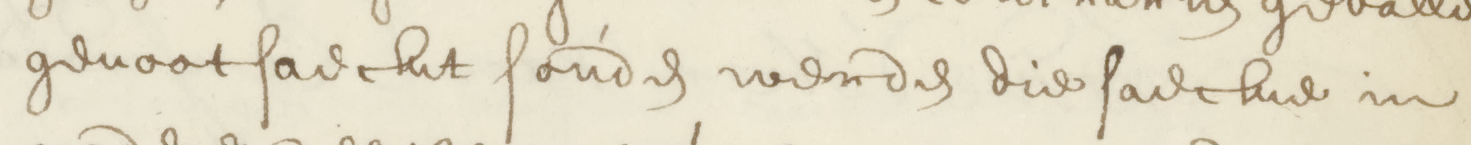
genootsaeckt souden werden die saecke in
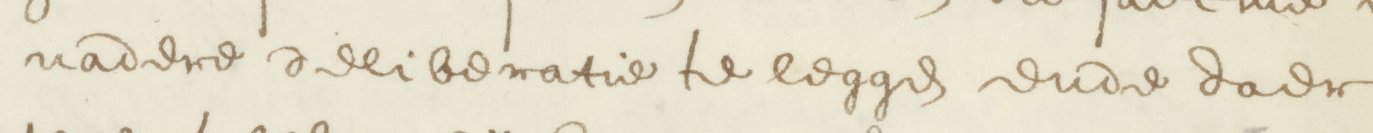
nadere deliberatie te leggen ende daer
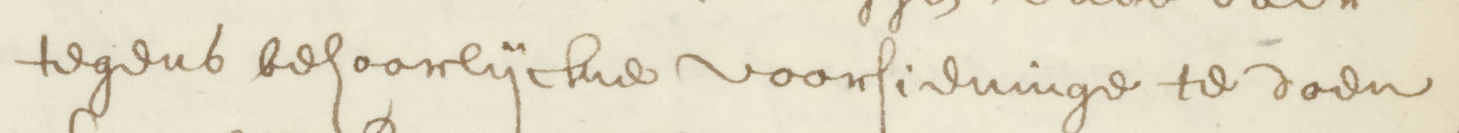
tegens behoorlijcke voorsieninge te doen;
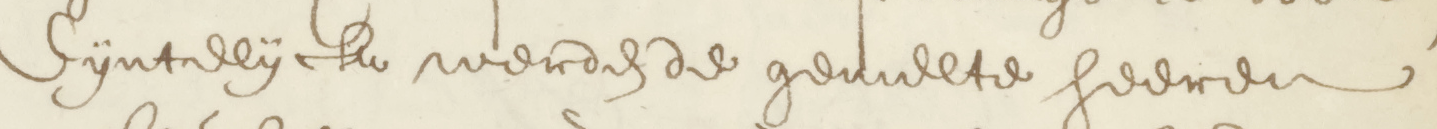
Eijntelijck werden de gemelte heeren
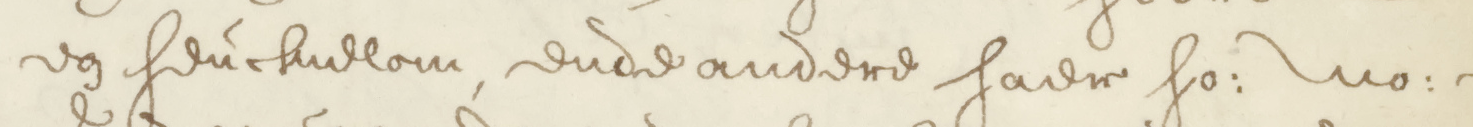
van Heuckelom, ende andere haer Ho:Mo:
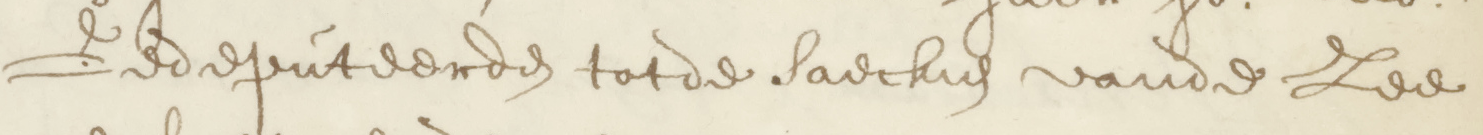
Gedeputeerden tot de Saecken vande Zee,
